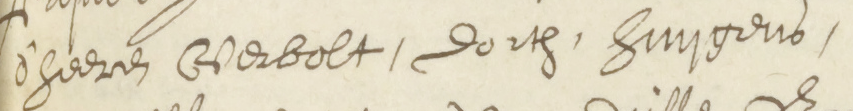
d‛heeren Verbolt, Dorth, Huygens,
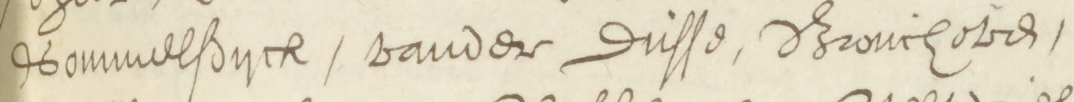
Sommelsdyck, vander Dusse, Brouchoven,
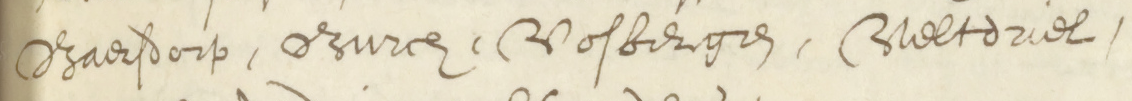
Baersdorp, Burch, Vosbergen, Veltdriel,
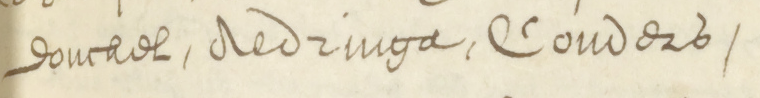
Donckel, Aldringa, Conders.
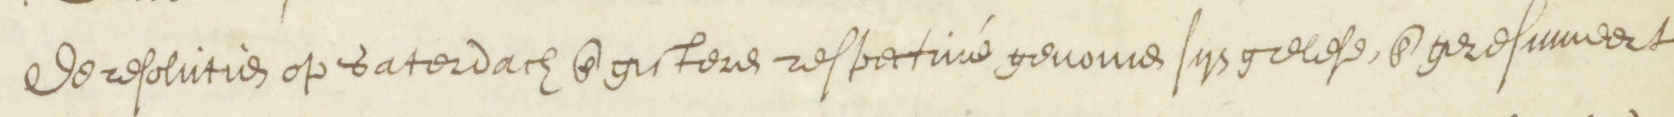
De resolutien op saterdach & gisteren respectiue genomen syn gelese, & geresumeert
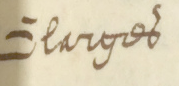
Glarges
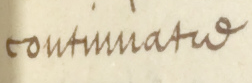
continuatie
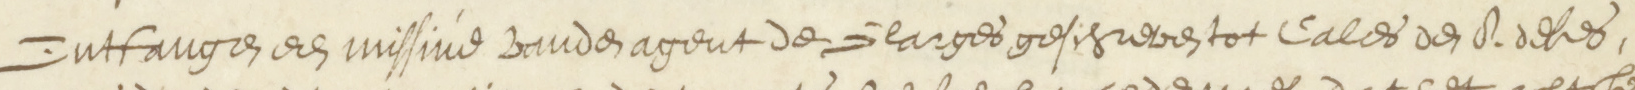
Ontfangen een missiue vanden agent de Glarges geschreven tot Cales den 8. deses,
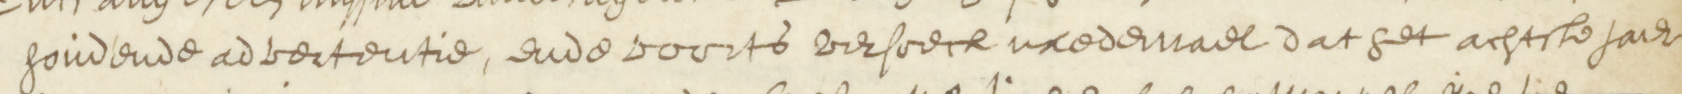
houdende advertentie, ende voorts versoeck naedermael dat het achtste jaer
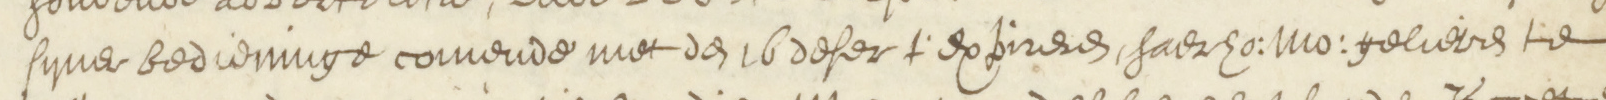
syner bedieninge comende met den 16 deser t‛expireren, haer ho:Mo: gelieven te
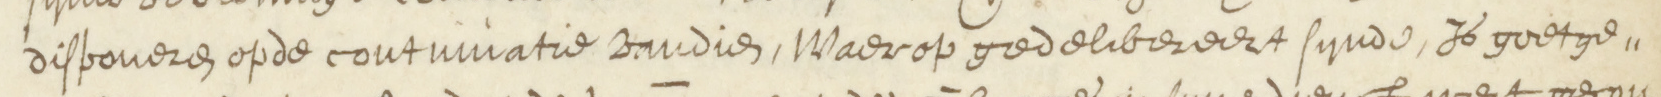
disponeren opde continuatie vandien, Waerop gedelibereert synde, Is goetge„
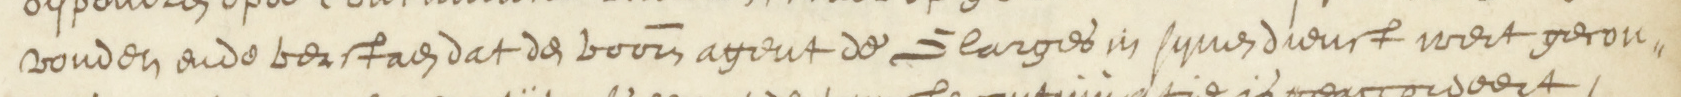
vonden ende verstaen dat den voorn agent de Glarges in synen dienst wert gecon„
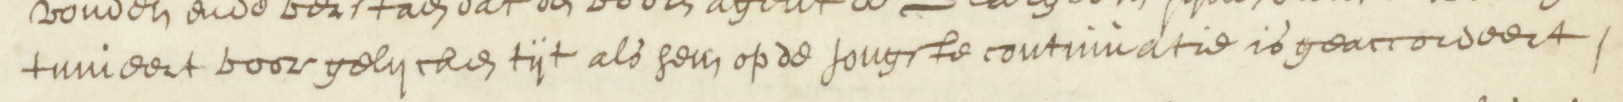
tinueert voor gelycken tijt als hem opde jongste continuatie is geaccordeert.
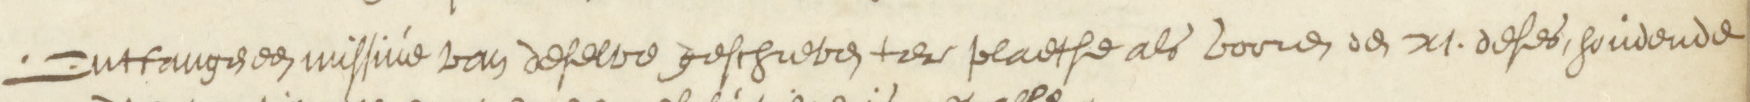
Ontfangen een missiue van deselve geschreven ter plaetse als vooren den xi. deses, houdende
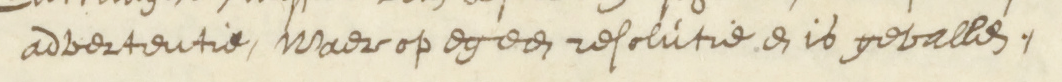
advertentie, Waer op egeen resolutie en is gevallen.
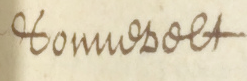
Sonnevelt
